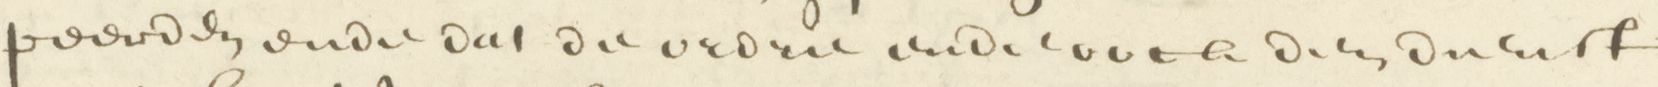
peerden ende dat de ordre ende oock den dienst
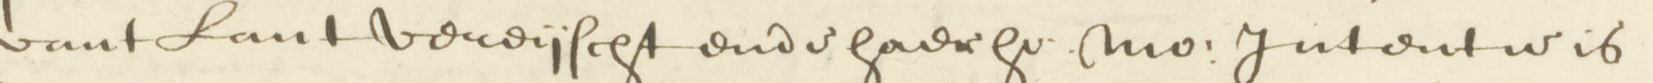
vant Lant vereijscht ende haere ho:mo: intentie is
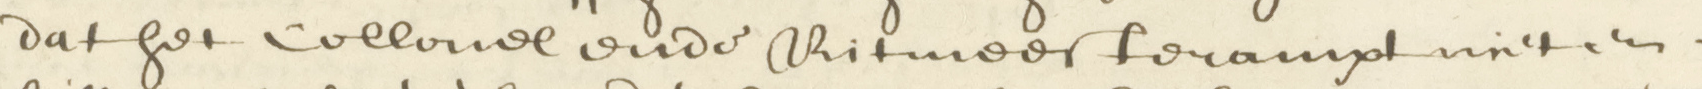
dat het Collonel ende Ritmeesterampt niet en
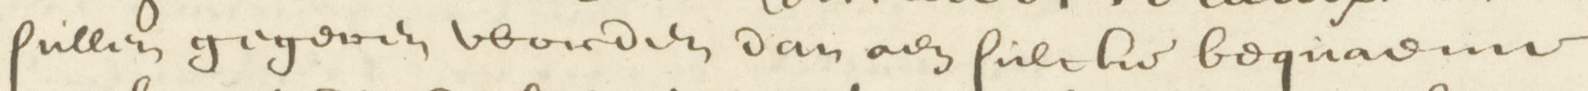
sullen gegeven worden dan aen sulcke bequaeme
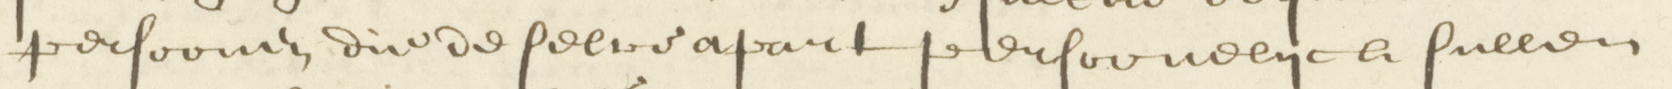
persoonen die de selve apart persoonelijck sullen
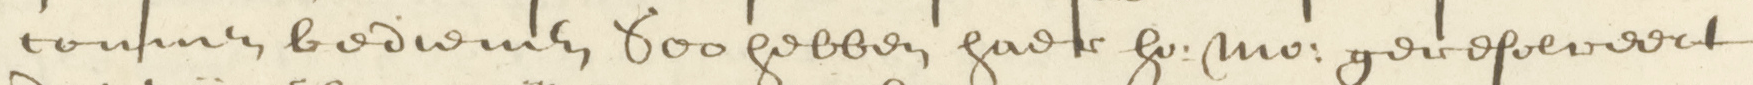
connen bedienen Soo hebben haer ho:mo: geresolveert
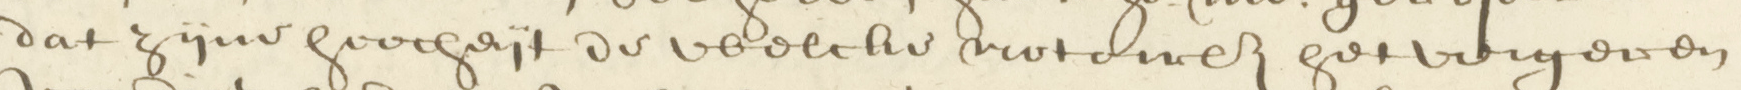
dat zijne hoocheijt de welcke notoirl het vergeven
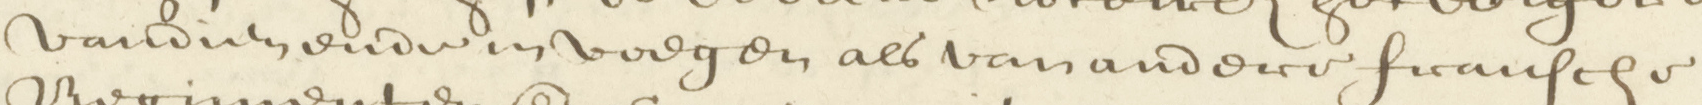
vandien ende in voegen als van andere Fransche
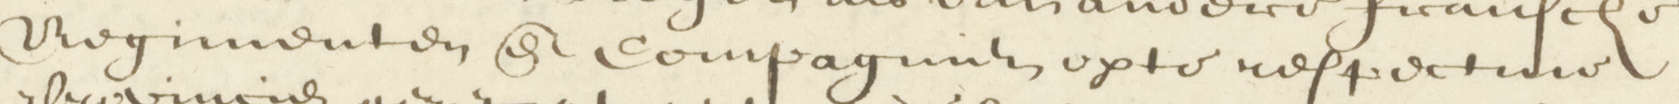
Regimenten & Compagnien opte respective
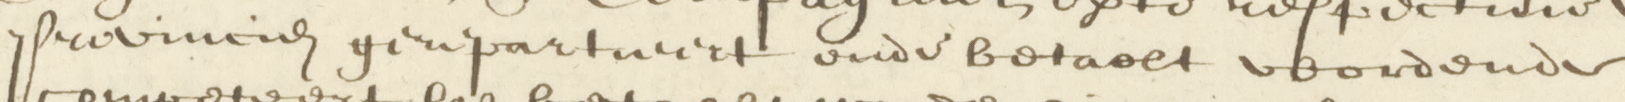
provincien gerepartieert ende betaelt wordende
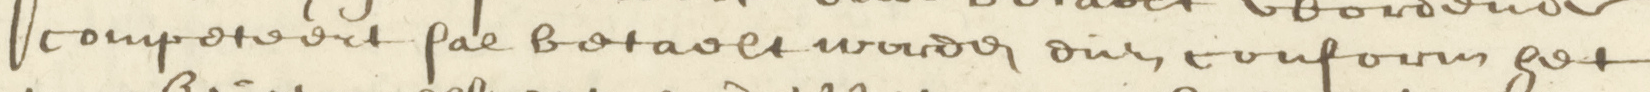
competeert sal betaelt worden dien conform het
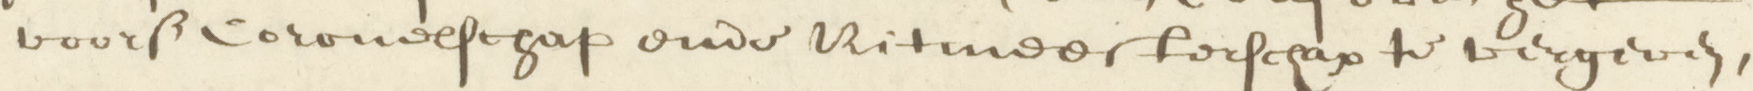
voors Coronelschap ende Ritmeesterschap te vergeven.
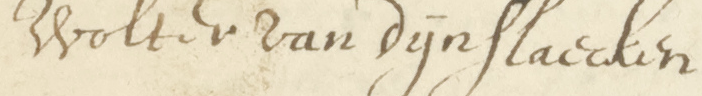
Wolter van dijnslaecken
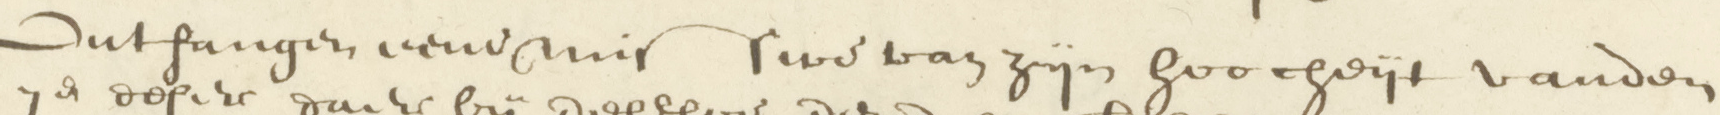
Ontfangen eene missive van zijn hoocheijt vanden
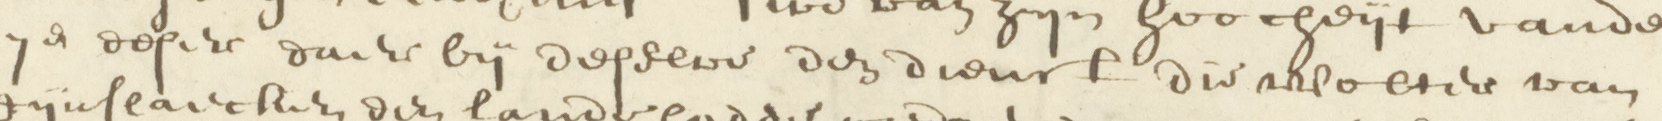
7e deser daer bij deselve den dienst die Wolter van
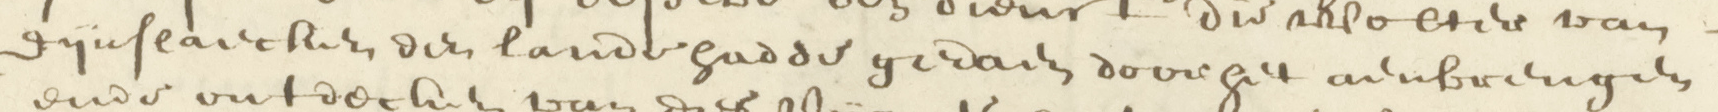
Dijnslaecken den lande hadde gedaen door het aenbrengen
